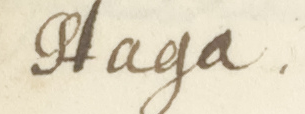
Haga
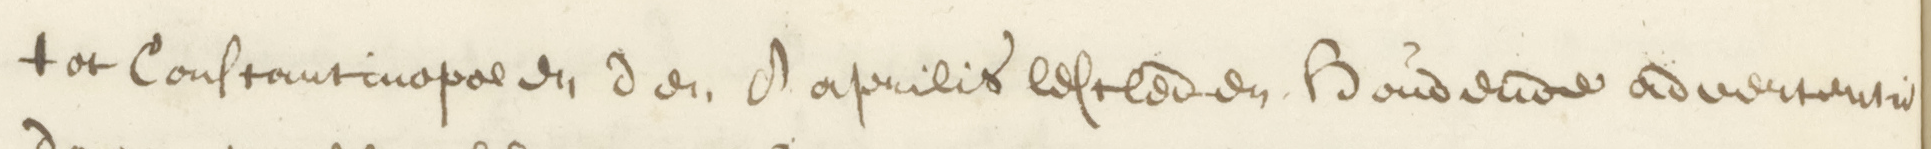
tot Constantinopelen den 8 aprilis lestleden houdende advertentie
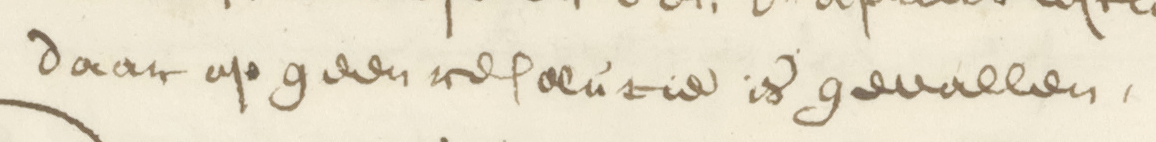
daar op geen resolutie is gevallen.
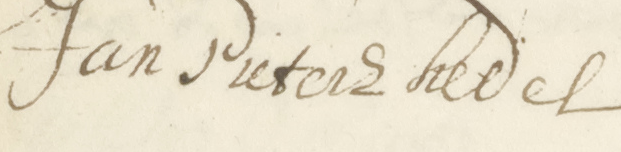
Jan Pieterz Hedel
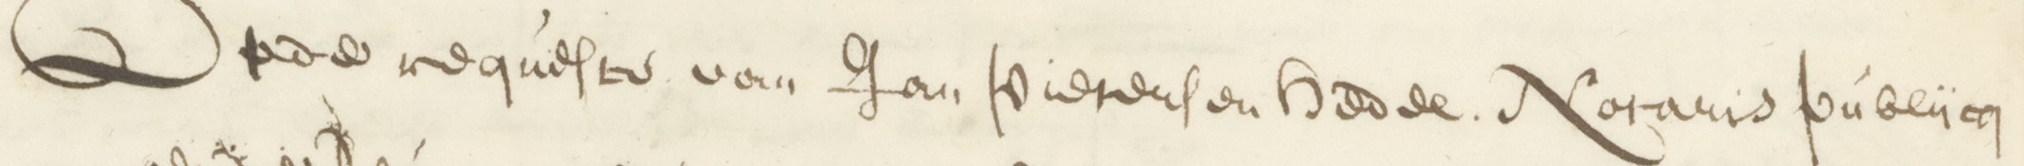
Opde requeste van Jan Pietersen Hedel Notaris Publijcq
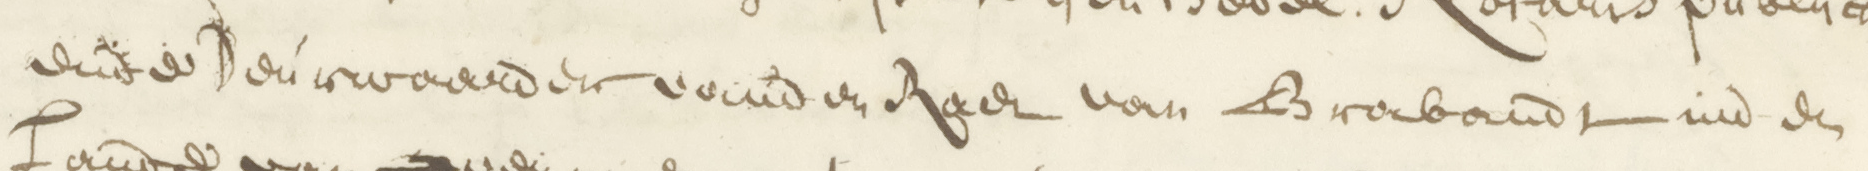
ende Deurwaerder vanden Raet van Brabandt inden
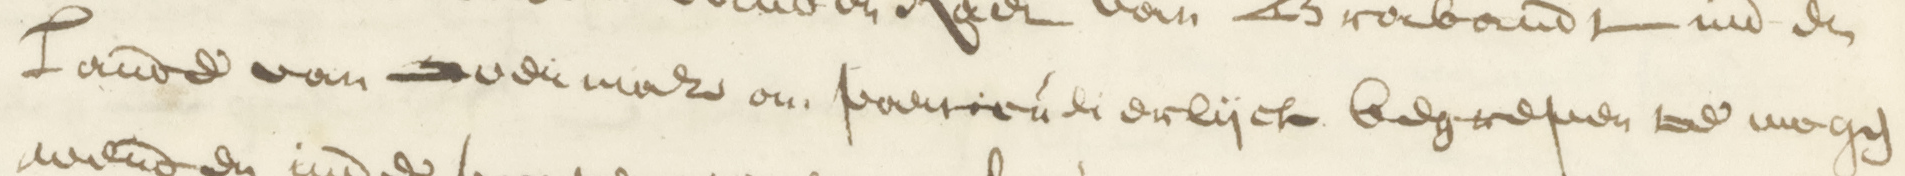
Lande van Overmaze om particulierlijck begrepen te mogen
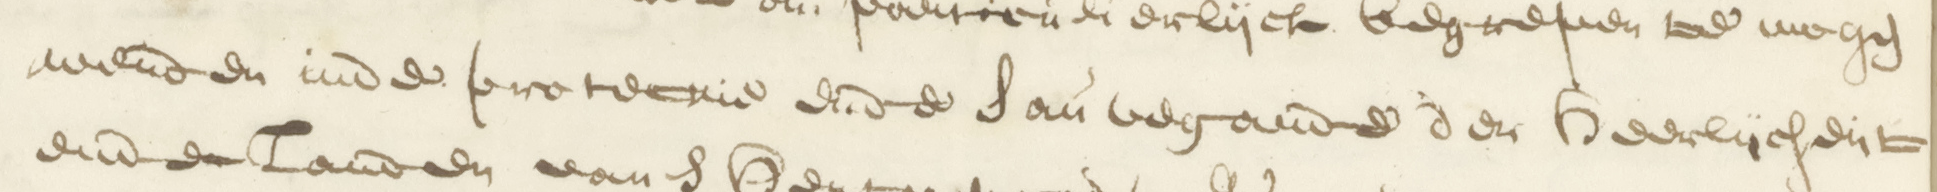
werden inde protectie ende sauvegarde der heerlijcheijt
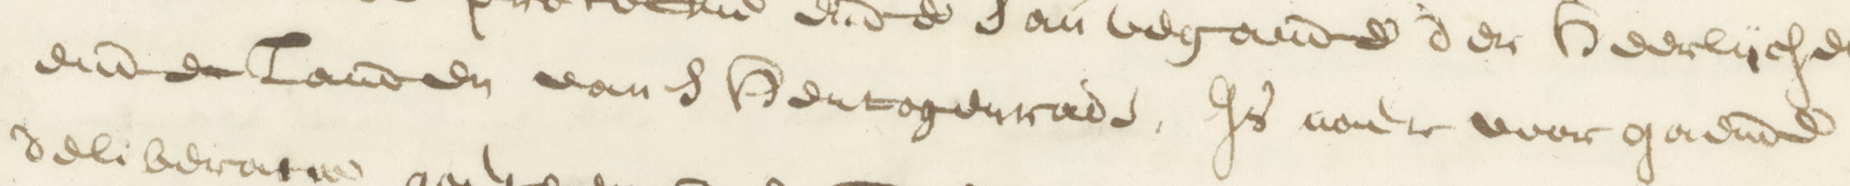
ende Landen van s Hertogenrade. Is naer voorgaende
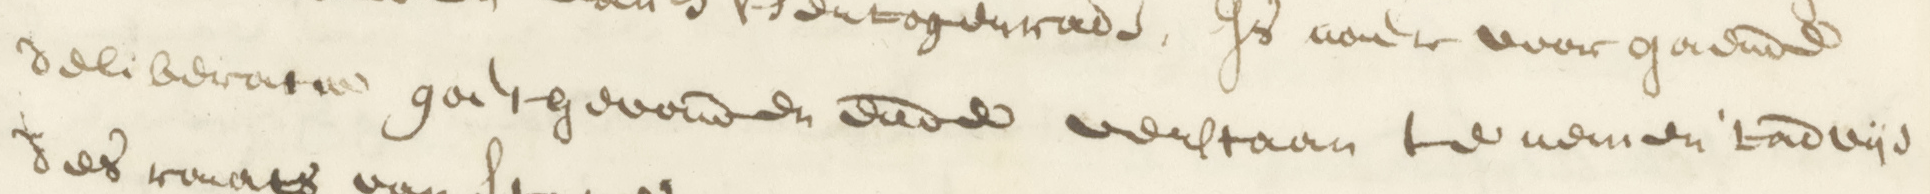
deliberatie goetgevonden ende verstaen te nemen 't advijs
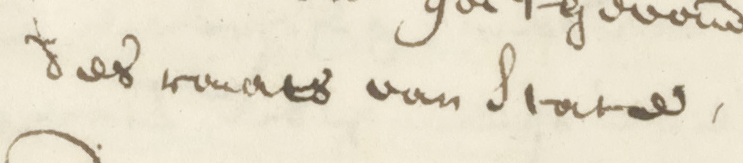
des raets van State.
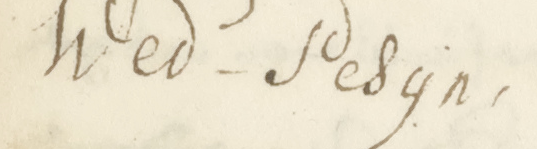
Wede. Pesijn
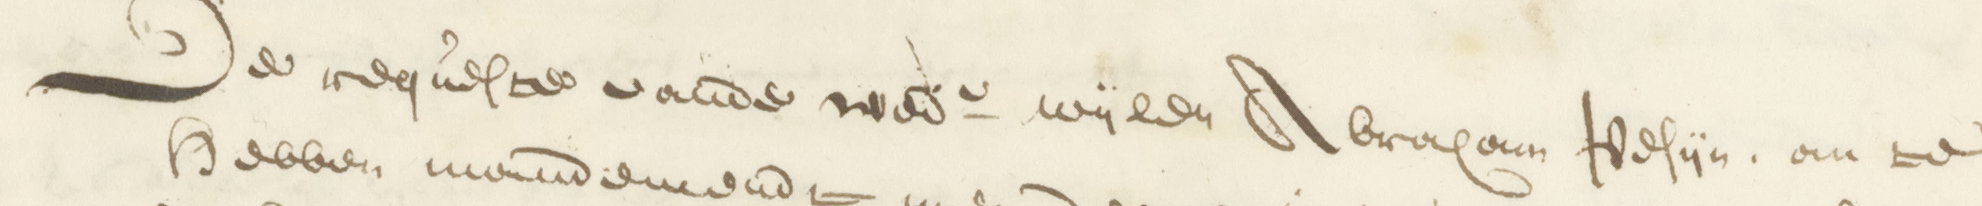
De requeste vande wede wijlen Abraham Pesijn, om te
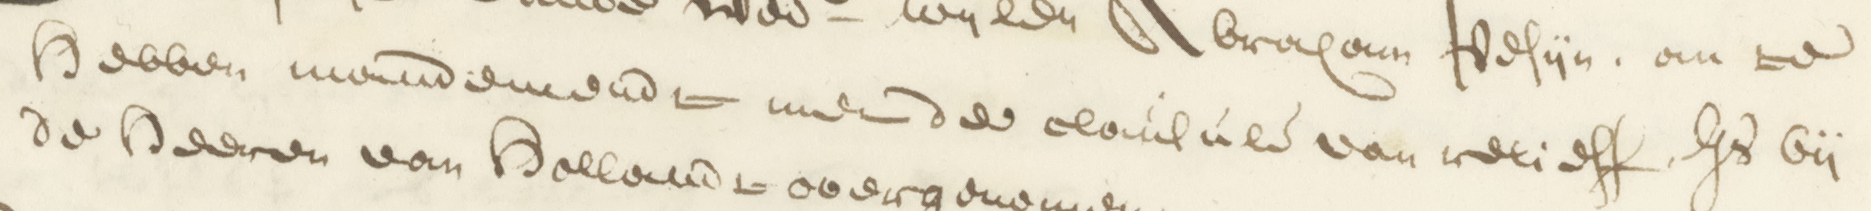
hebben mandemendt met de clausule van relieff. Is bij
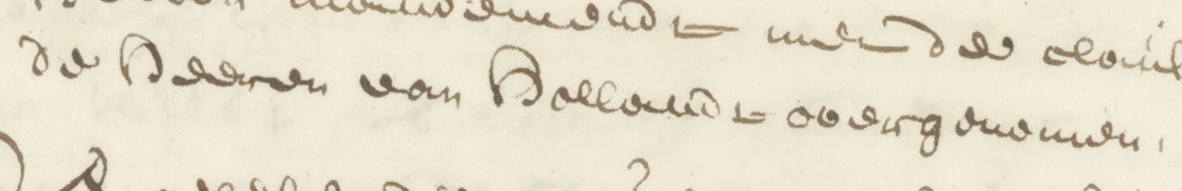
de heeren van Hollandt overgenomen.
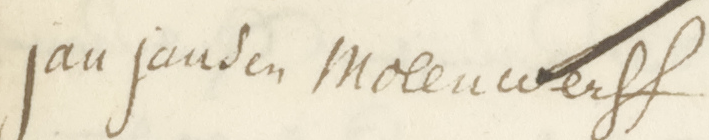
jan jansen Molenwerff
